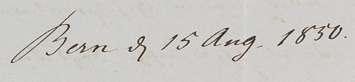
Bern den 15 Aug. 1850.
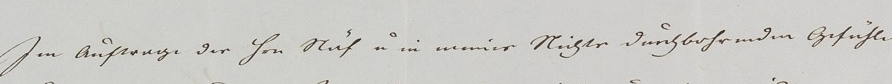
Im Auftrage des Hrn. Näfu in meines Nichts durchbohrenden Gefühle
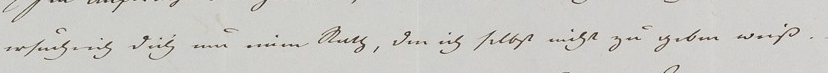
ersuche ich Dich um einen Rath, den ich selbst nicht zu geben weiß. –
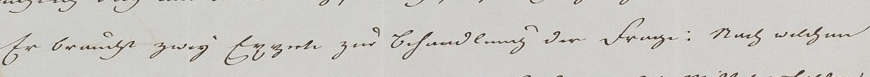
Er braucht zwey Experten zur Behandlung der Frage: Nach welchem
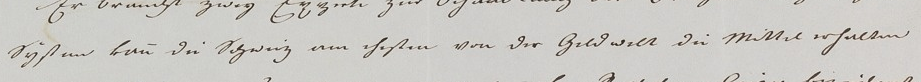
System kann die Schweiz am ehesten von der Geldwelt die Mittel erhalten
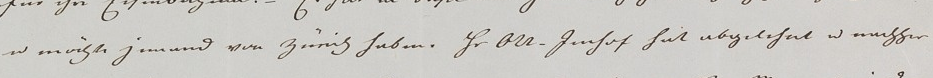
u möchte jemand von Zürich haben. Hr Ott-Imhof hat abgelehnt u nachher
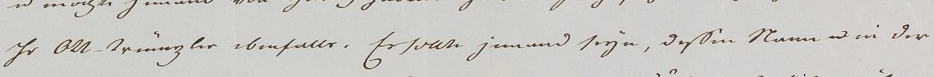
Hr Ott-Trümpler ebenfalls. Es sollte jemand seyn, dessen Name in der
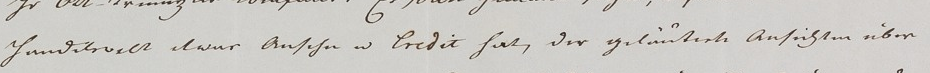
Handelswelt etwas Ansehen u Credit hat, der geläuterte Ansichten über
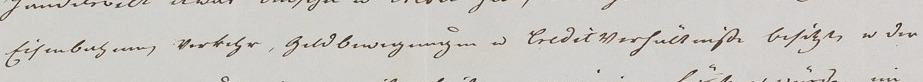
Eisenbahnen, Verkehr, Geldbewegungen u Credtiverhältniße besitzt, u der
